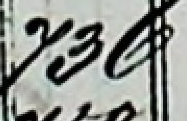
736
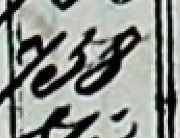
758
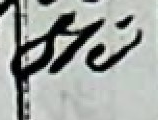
813
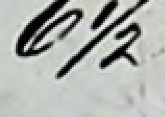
6 ½
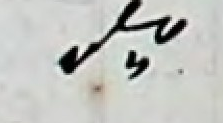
do
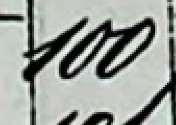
100
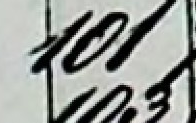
101
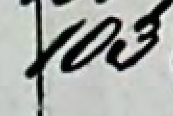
103
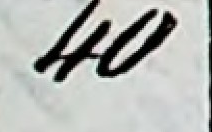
40
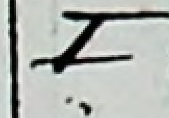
I
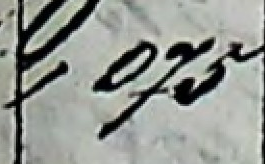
0,075
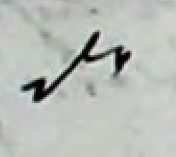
do
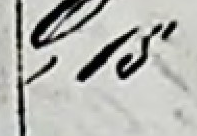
0,15
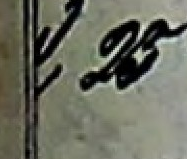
3,25
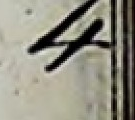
4
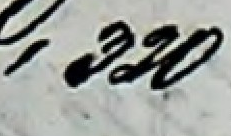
0,320
